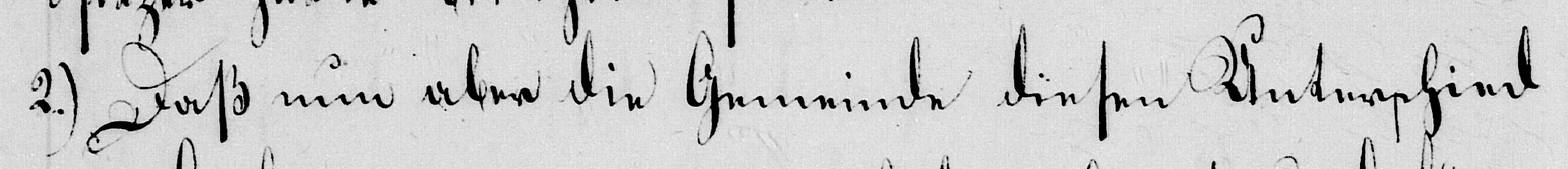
2.) Daß nun aber die Gemeinde diesen Unterschied
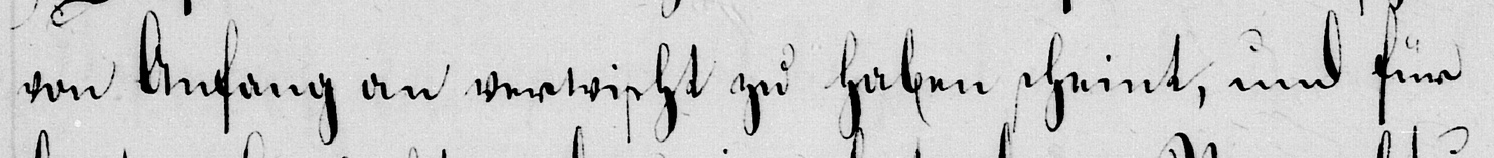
von Anfang an verwischt zu haben scheint, und für
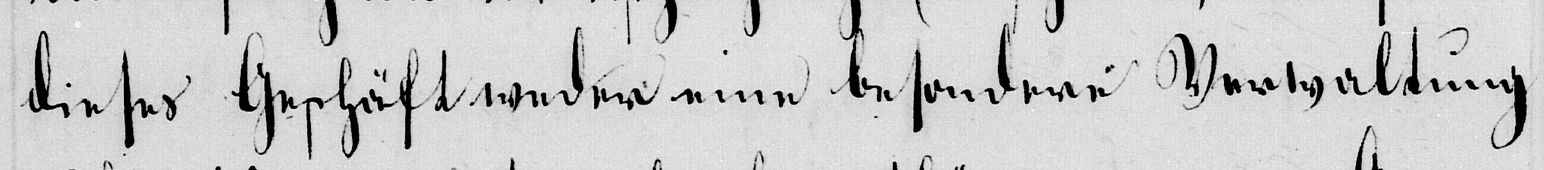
dieses Geschäft weder eine besondere Verwaltung
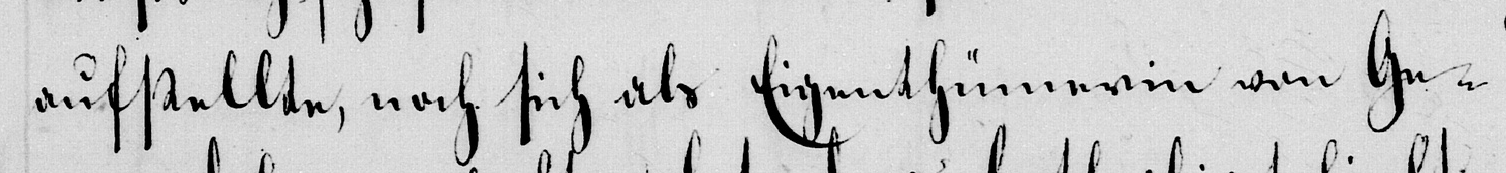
aufstellte, noch sich als Eigenthümer von Ge¬
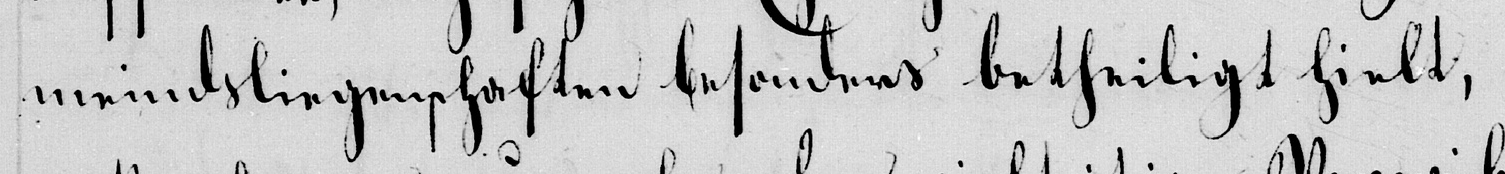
meindsliegenschaften besonders betheiligt hielt,
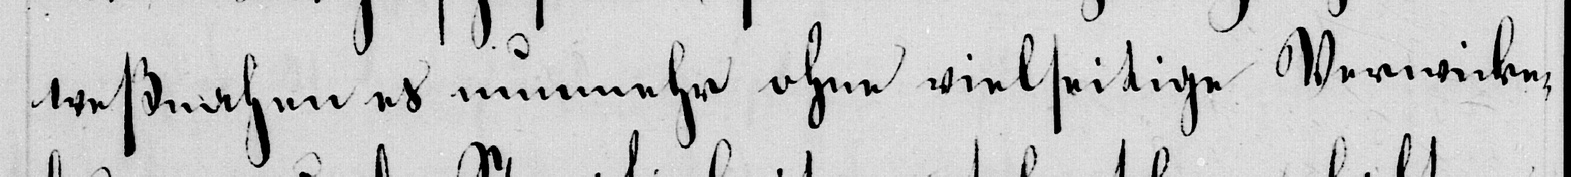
weßnahen es nunmehr ohne vielseitige Verwicke¬
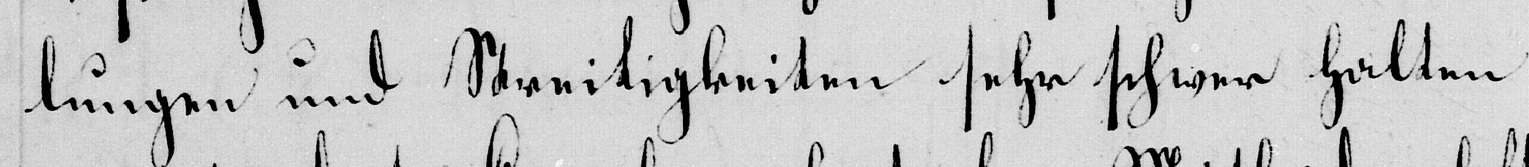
lungen und Streitigkeiten sehr schwer halten
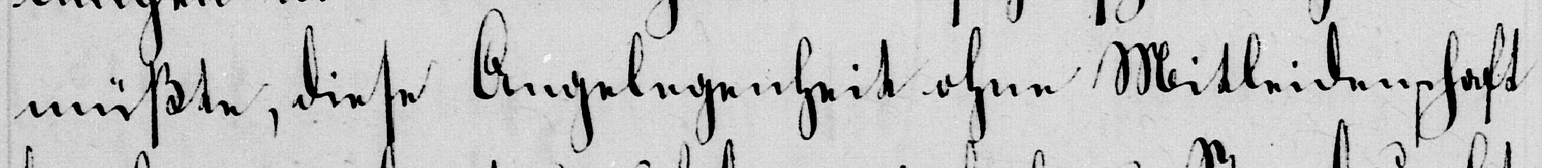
müße, diese Angelegenheit ohne Mitleidenschaft
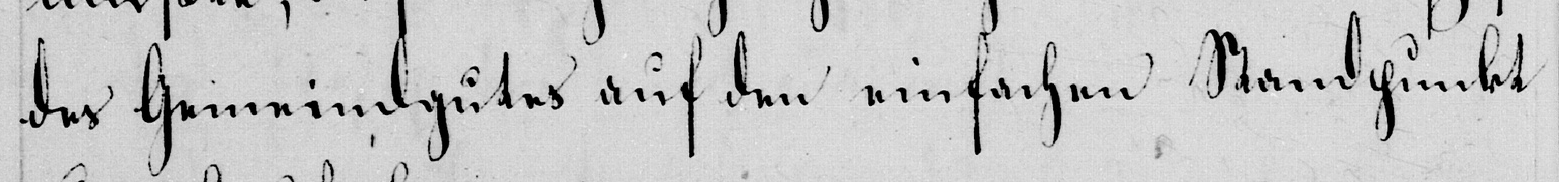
des Gemeindgutes auf den einfachen Standpunkt
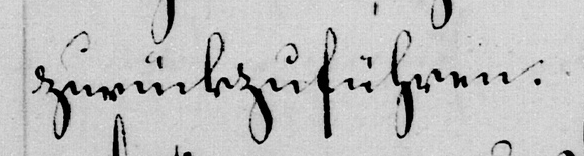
zurückzuführen.
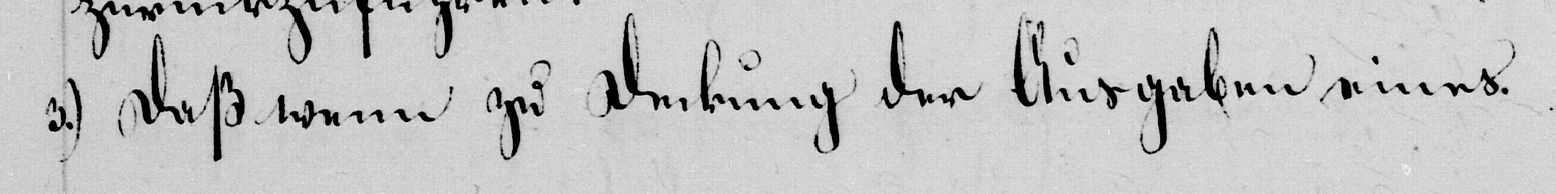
3.) Daß wenn zu Deckung der Ausgaben eines
